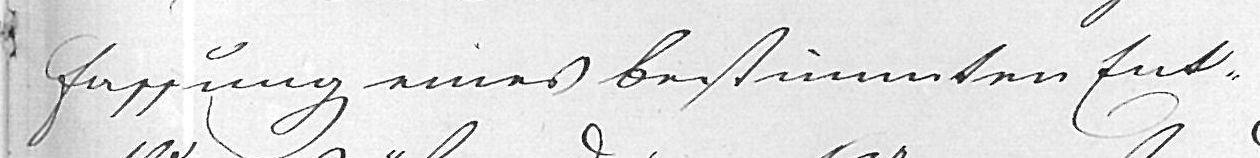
Fassung eines bestimmte Ent-
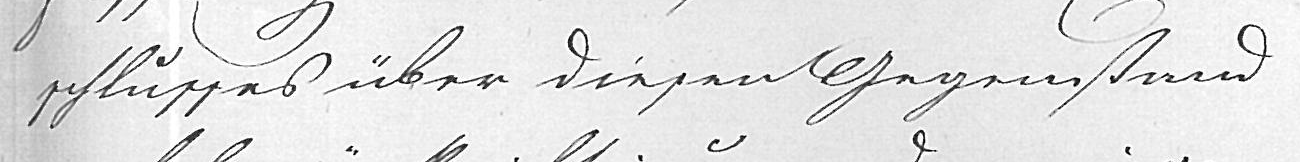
schlusses über diesen Gegenstand
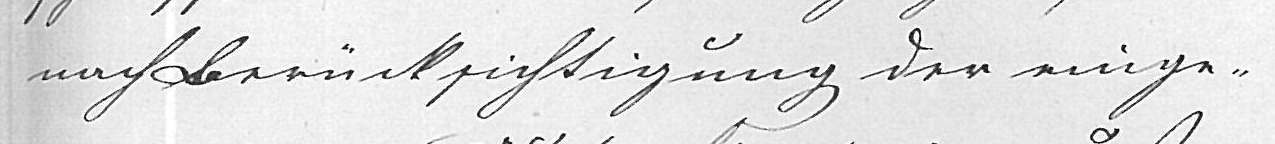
nach Berücksichtigung der einge-
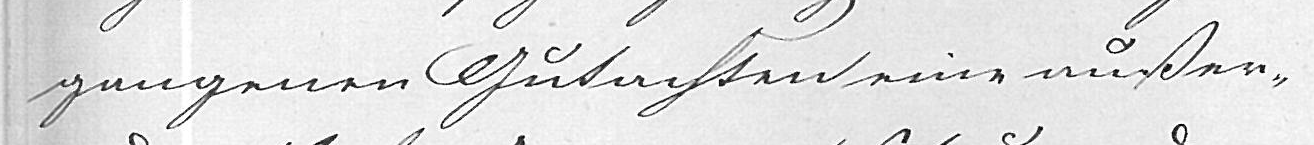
gangenen Gutachten eine außer-
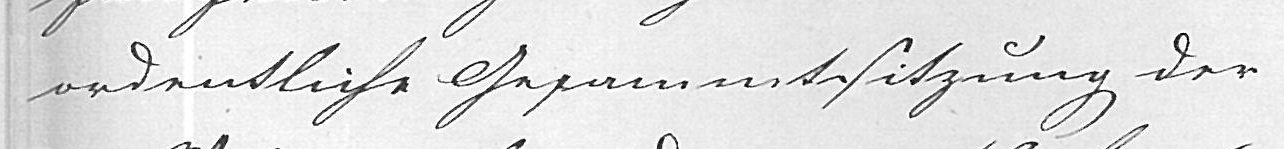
ordentliche Gesamtsitzung der
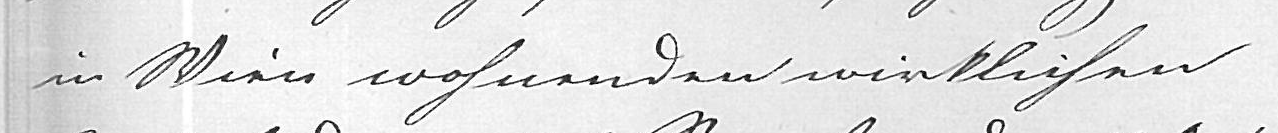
im Wien wohnenden wirklichen
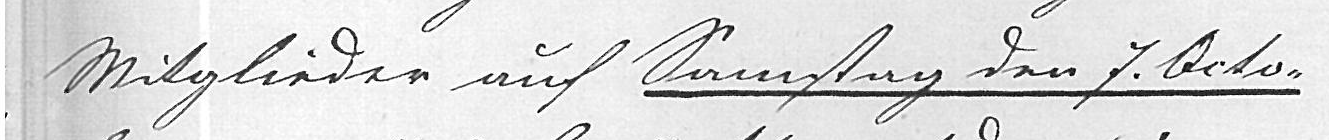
Mitglieder auf Samstag den 7. Octo-.
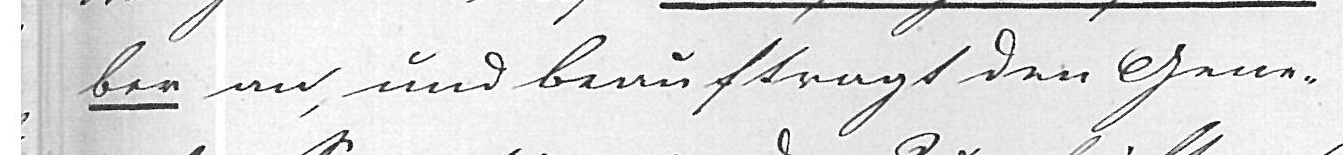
ber an und beauftragt den Gene-
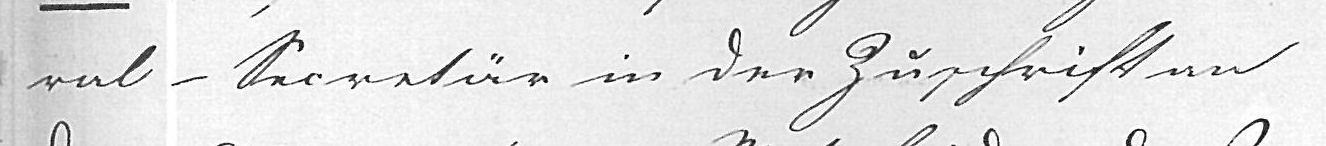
ral-Secretär in der Zuschrift an
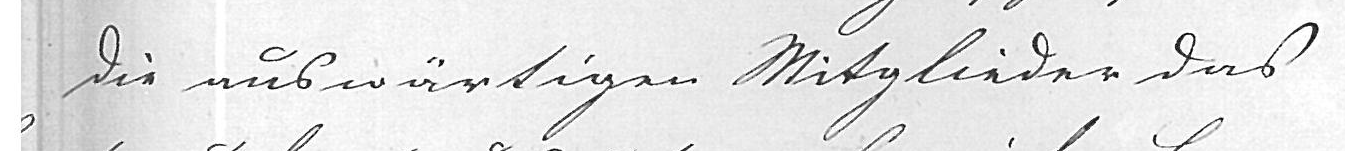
die auswärtigen Mitglieder das
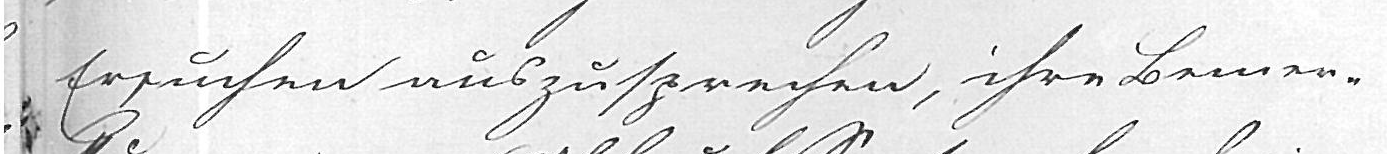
Ersuchen auszusprechen, ihre Bemer-
